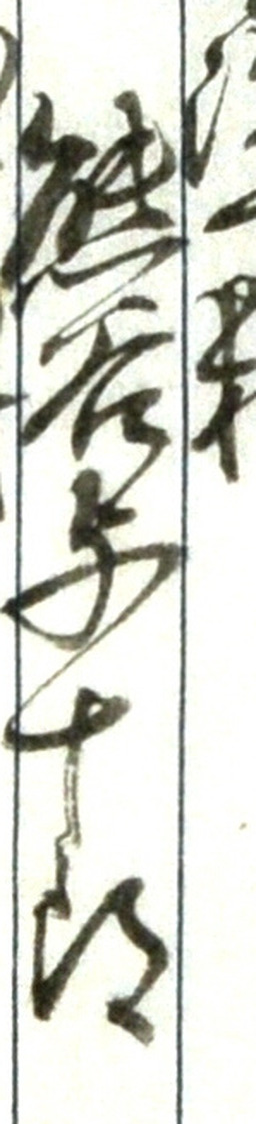熊谷与十郎

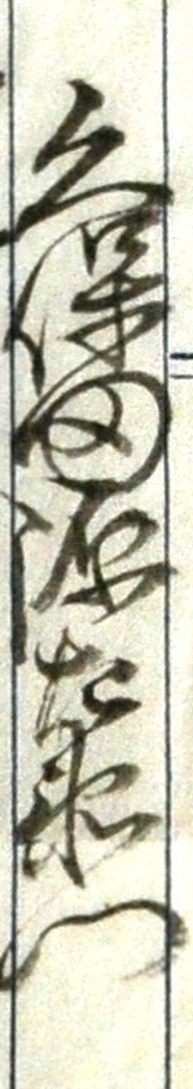久保田源左衛門
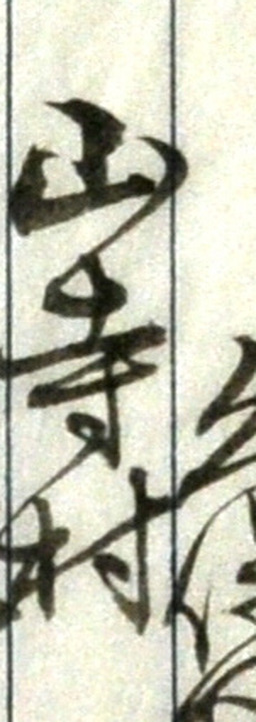山寺村
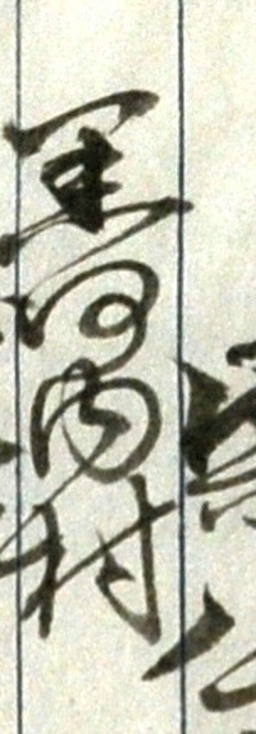黒河内村
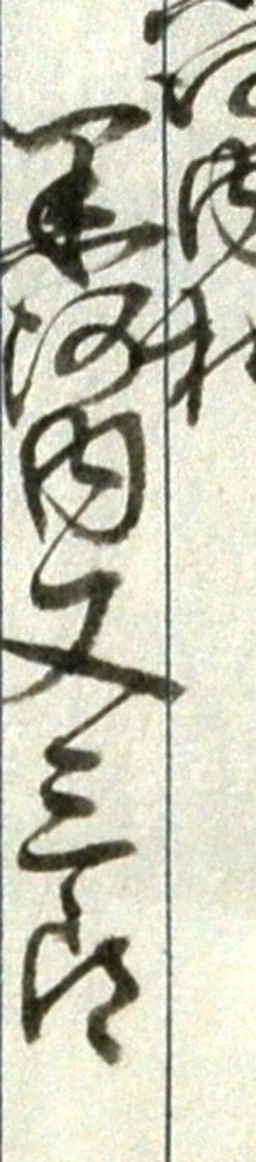黒河内又三郎
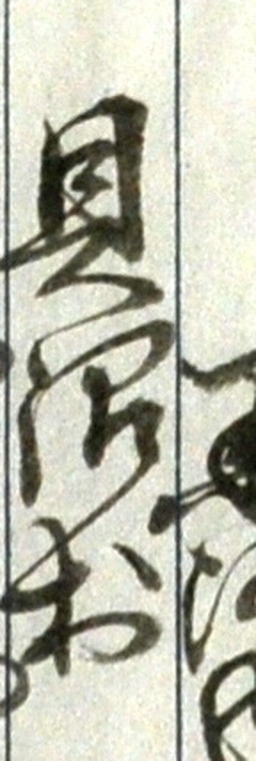貝沼村
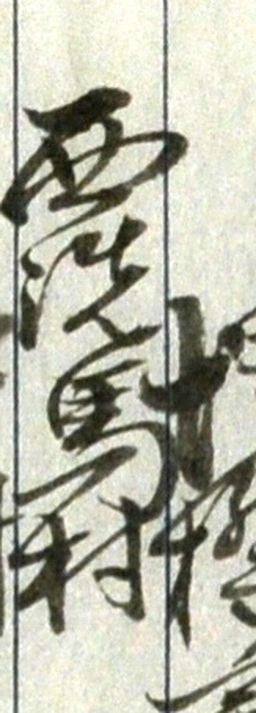西洗馬村
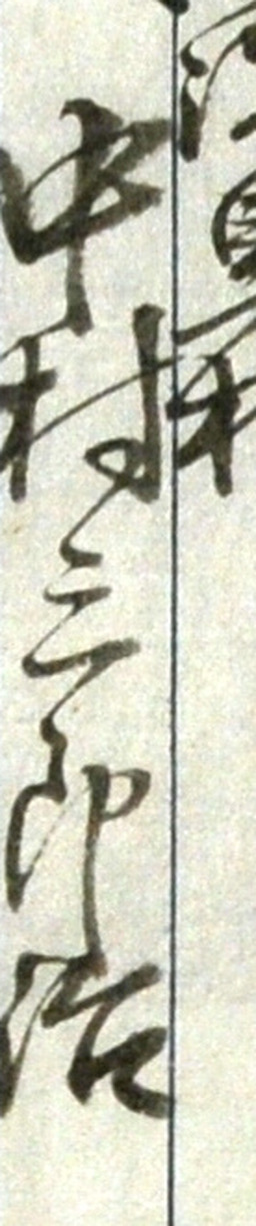中村三郎治
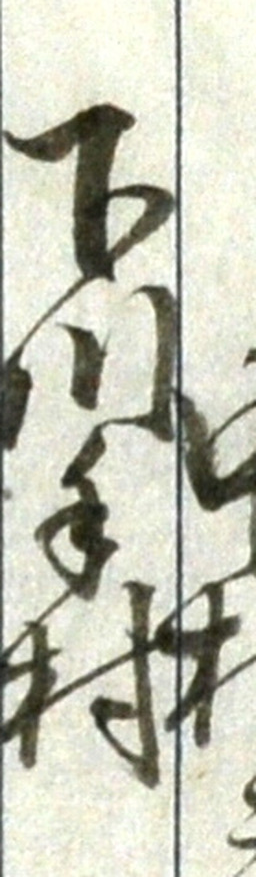下川手村
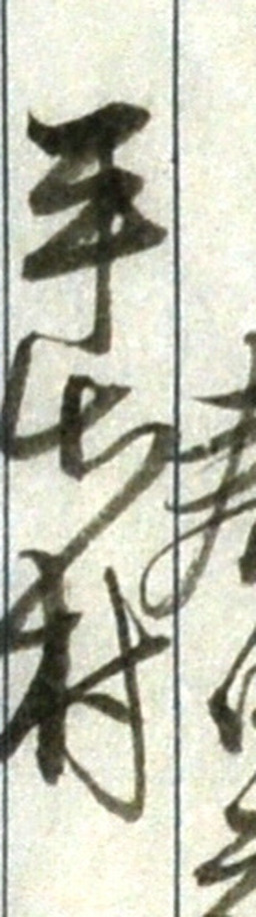平出村
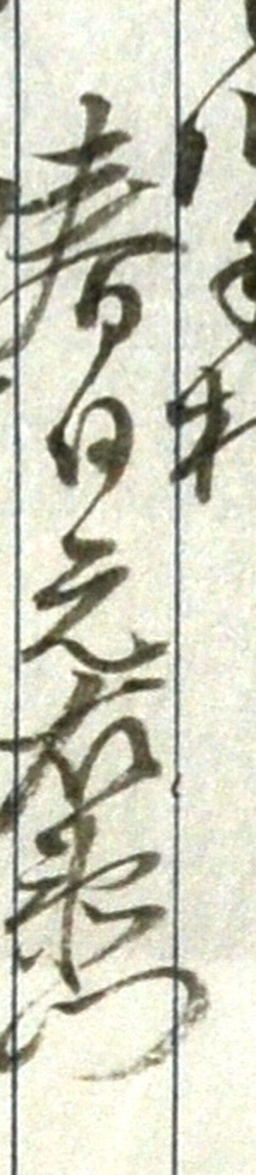春日元右衛門
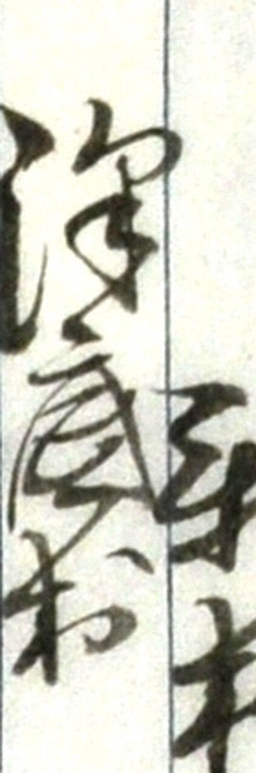沢底村
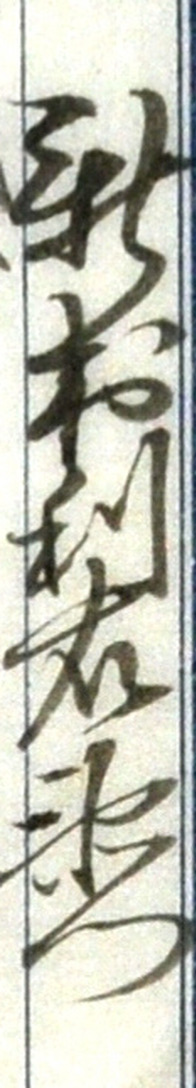新村利右衛門
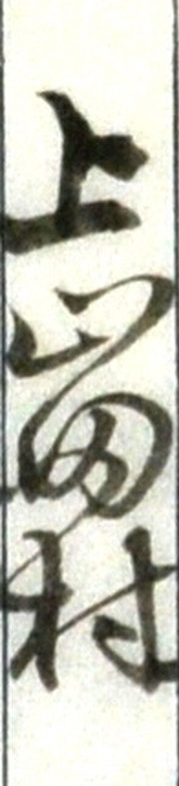上山田村
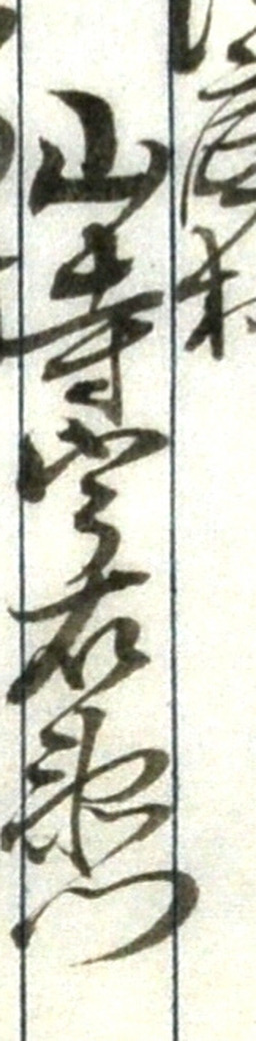山寺宇右衛門
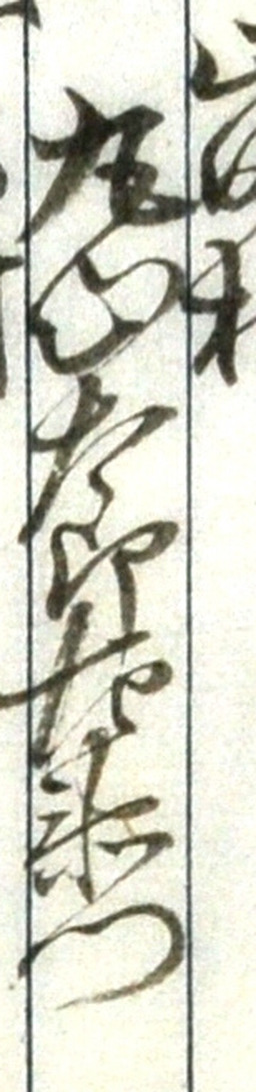丸山太郎左衛門
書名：大阪御進初人足数改帳（抄出）
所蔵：伊那市立高遠町図書館・合同会社AMANE
